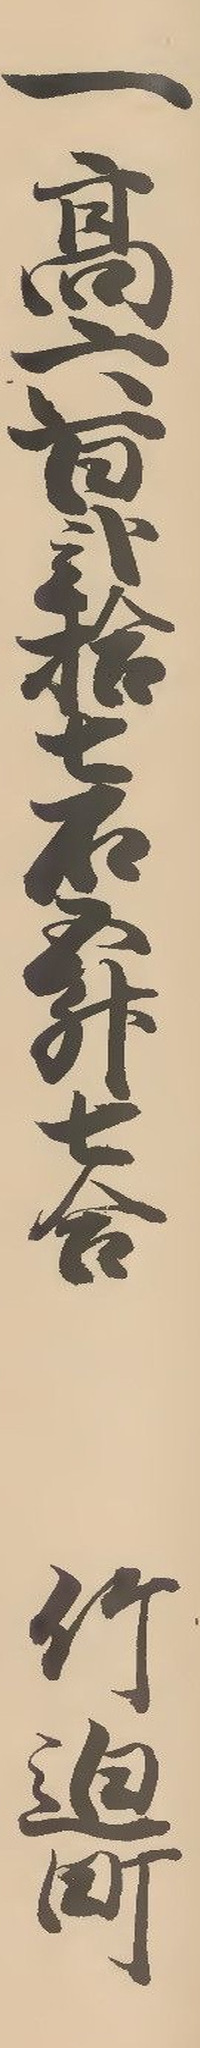一髙六百弐拾七石五升七合竹迫町
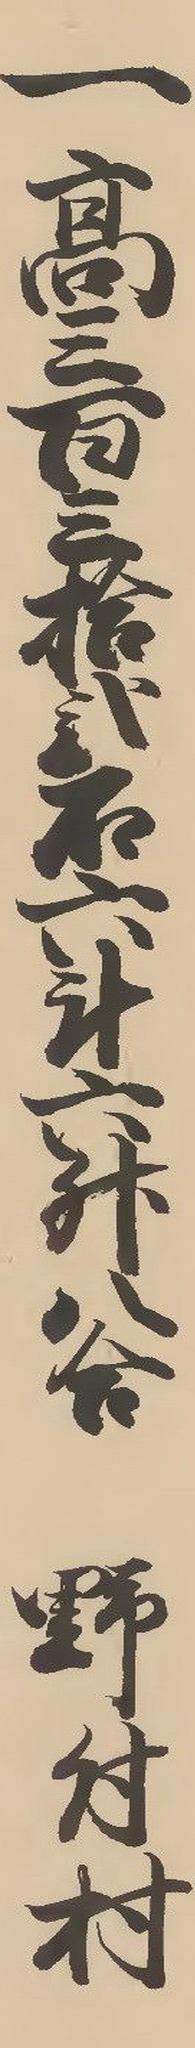一髙三百三拾弐石六斗六升八合野付村
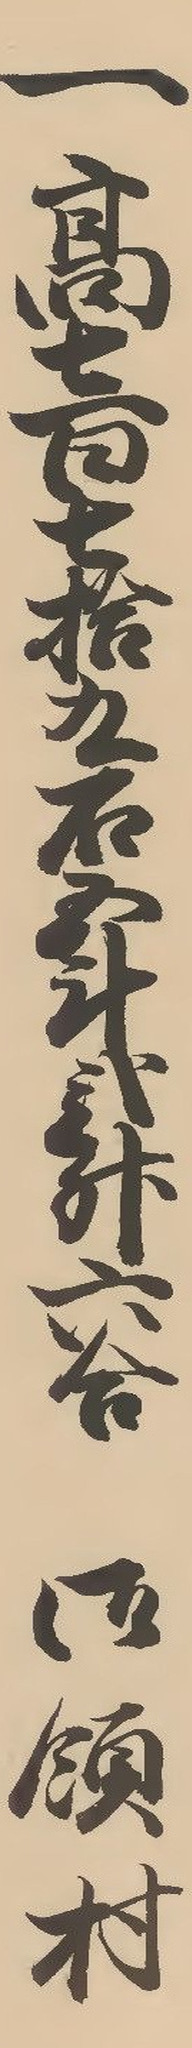一髙七百七拾九石五斗弐升六合御領村
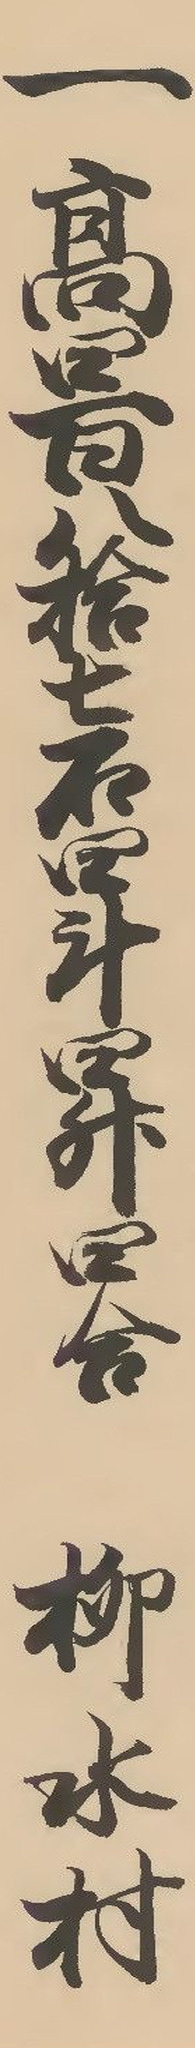一髙四百八拾七石四斗四升四合柳水村

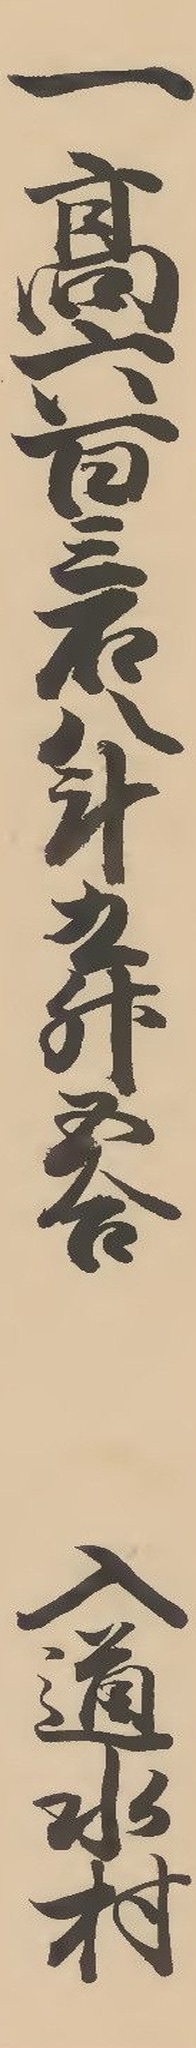一髙六百三石八斗九升五合入道水村
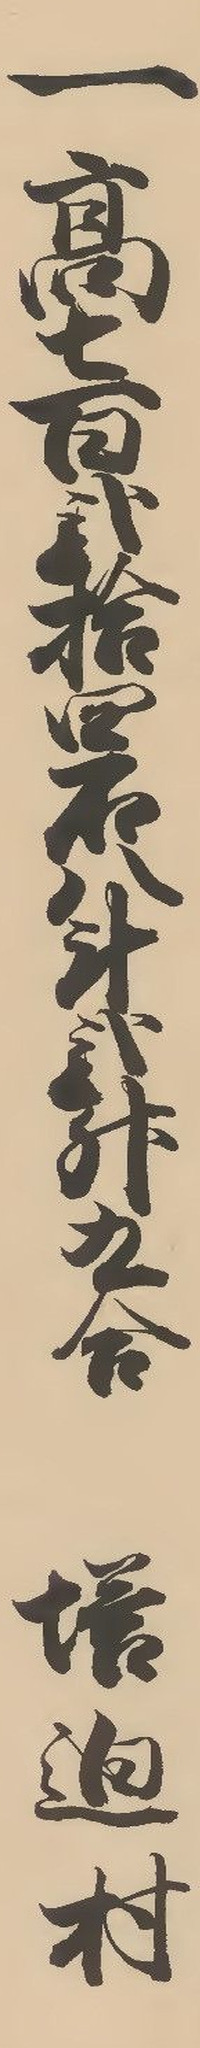一髙七百弐拾四石八斗弐升九合塔迫村
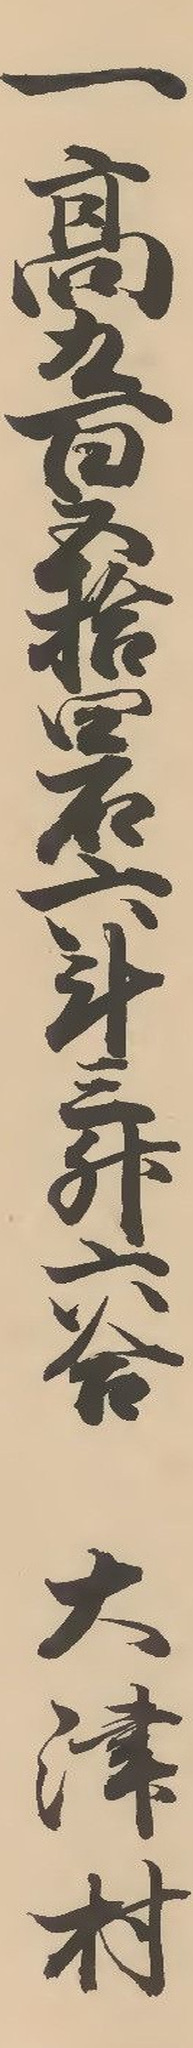一髙九百五拾四石六斗三升六合大津村
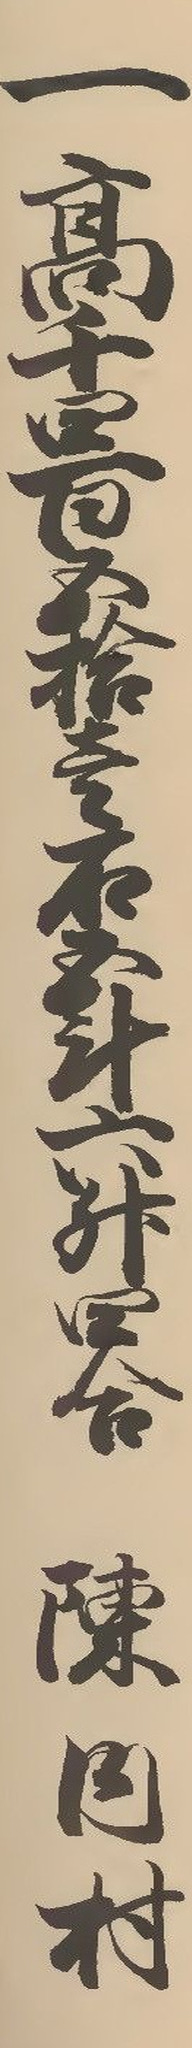一髙千四百五拾壱石五斗六升四合陳内村
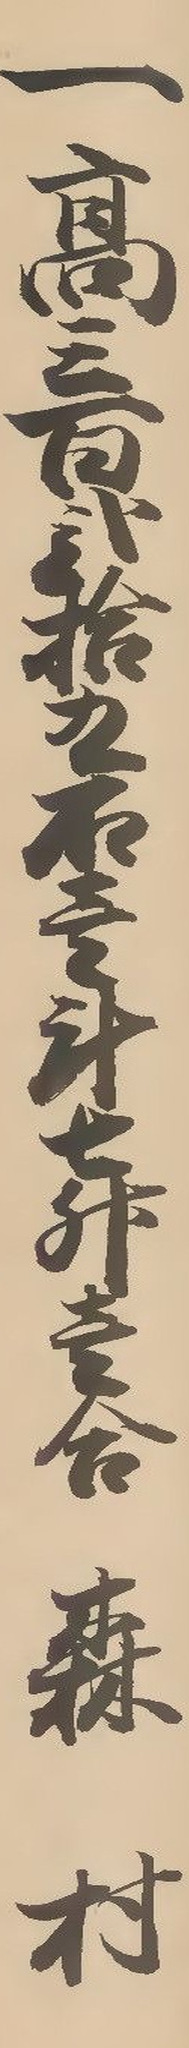一髙三百弐拾九石壱斗七升壱合森村
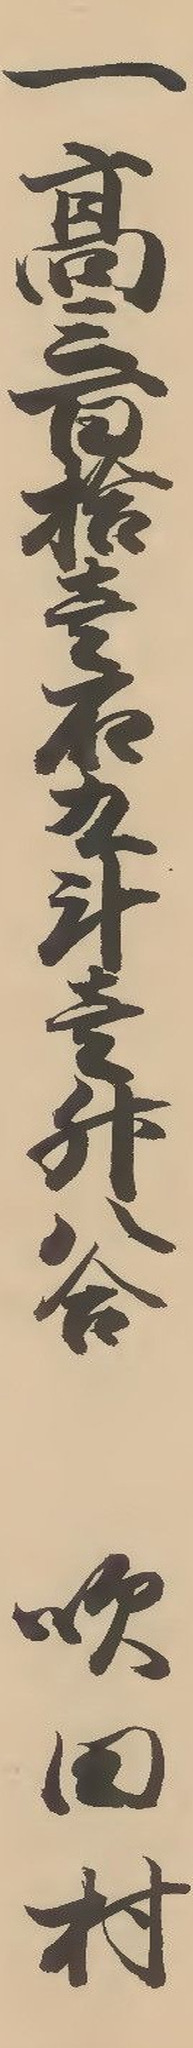一髙三百拾壱石九斗壱升八合吸田村
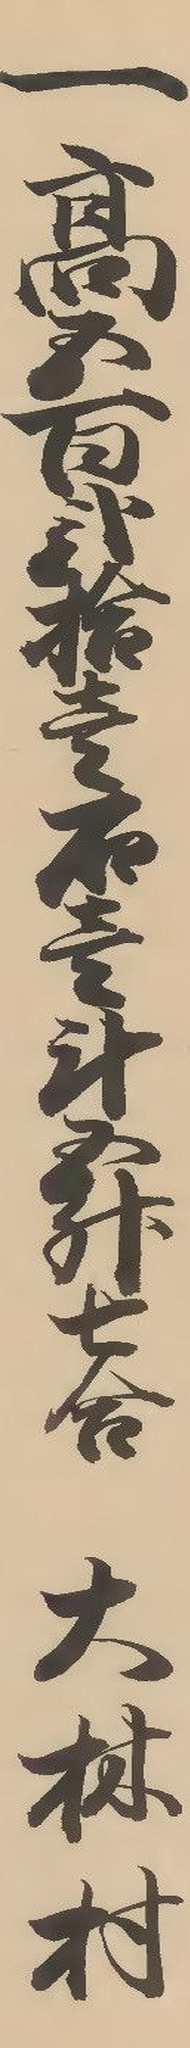一髙五百弐拾壱石壱斗五升七合大林村
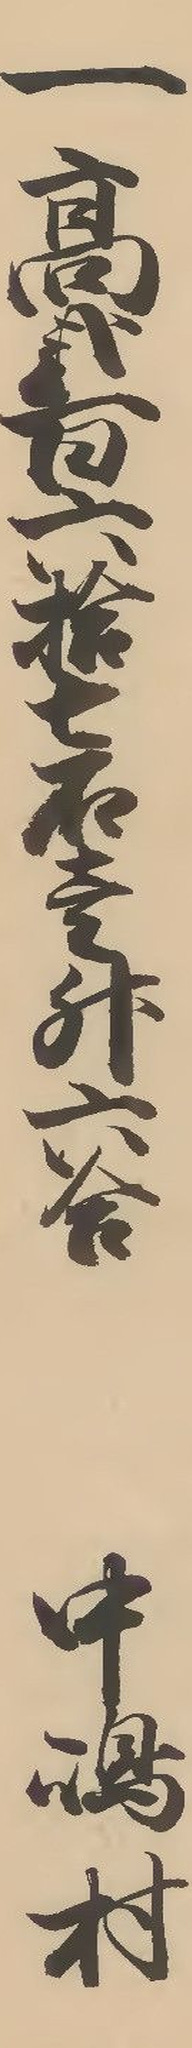一髙弐百六拾七石壱升六合中嶋村

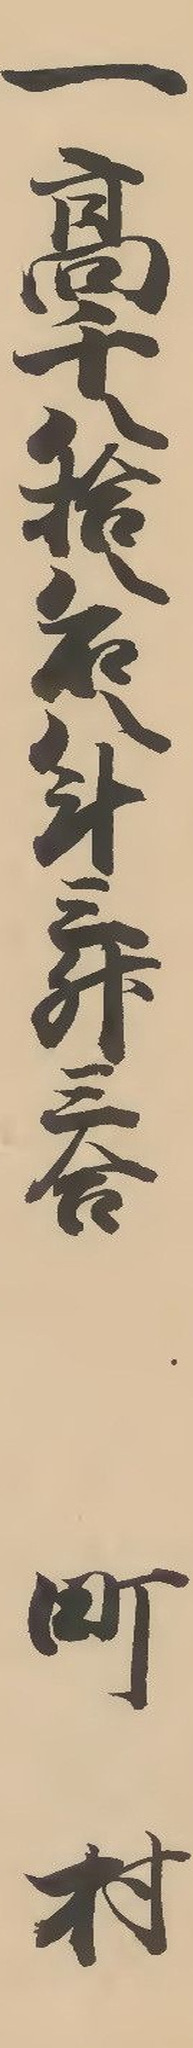一髙千八拾八石八斗三升三合町村
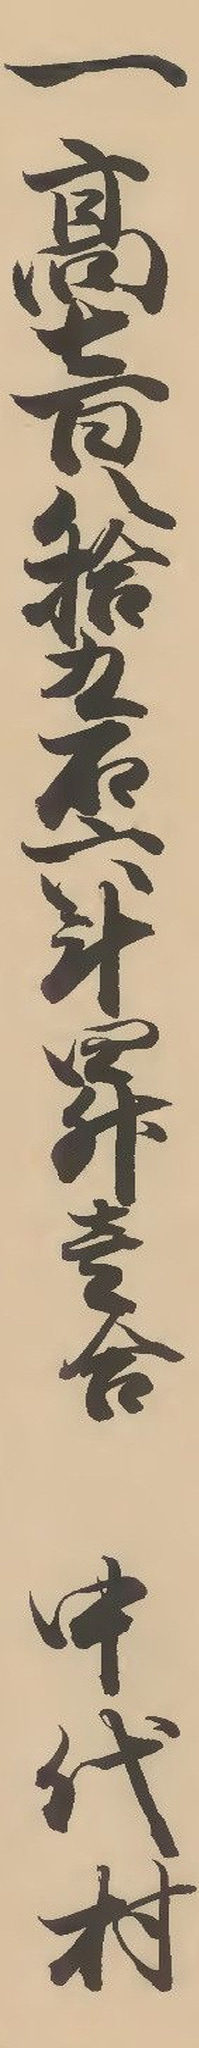一髙七百八拾九石六斗四升壱合中代村
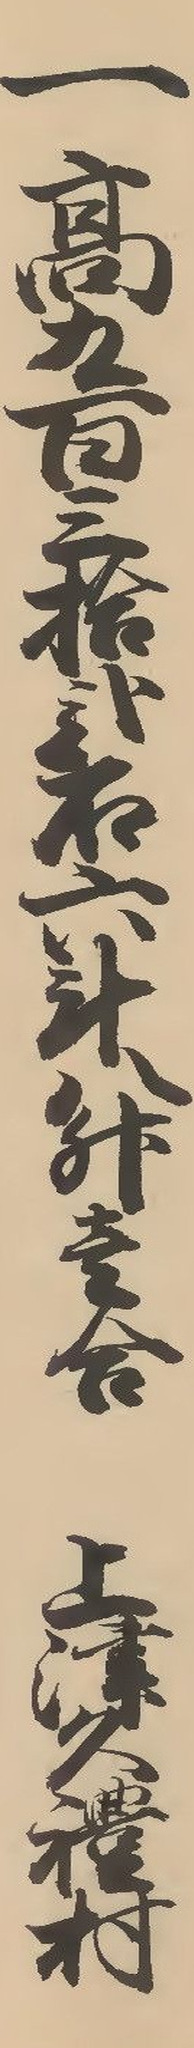一髙九百三拾弐石六斗八升壱合上津久禮村
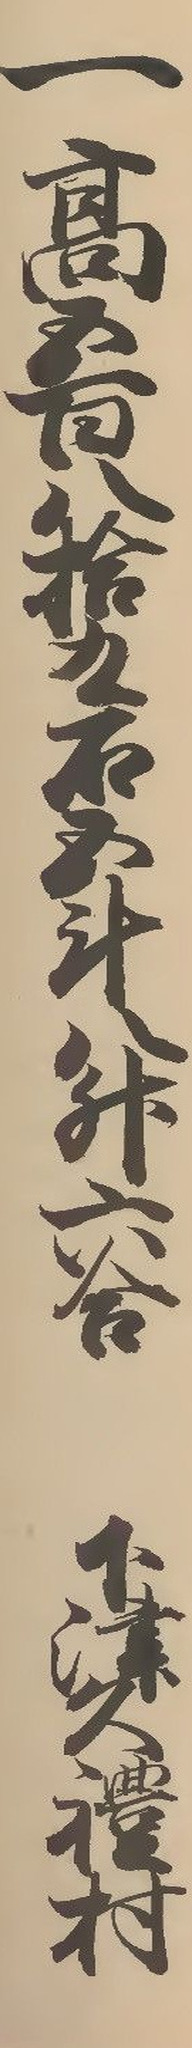一髙五百八拾九石五斗八升六合下津久禮村
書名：肥後国郷帳
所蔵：国立公文書館 National Archives of Japan
